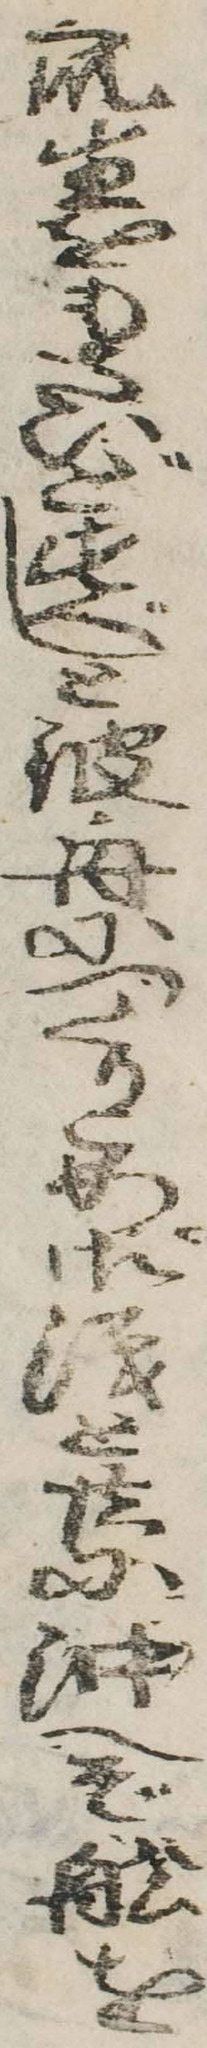衆生をもさいどすべしと彼舟につくりとめ。御涙と共に沖へぞ船を
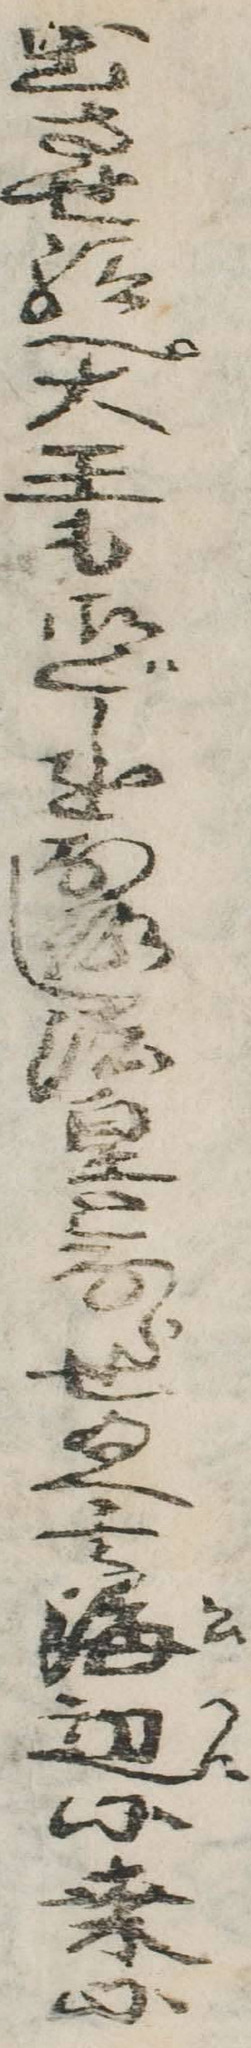出させ給へ。大王も御ぐしをおろし法皇とならせ給へ其海辺に桑に
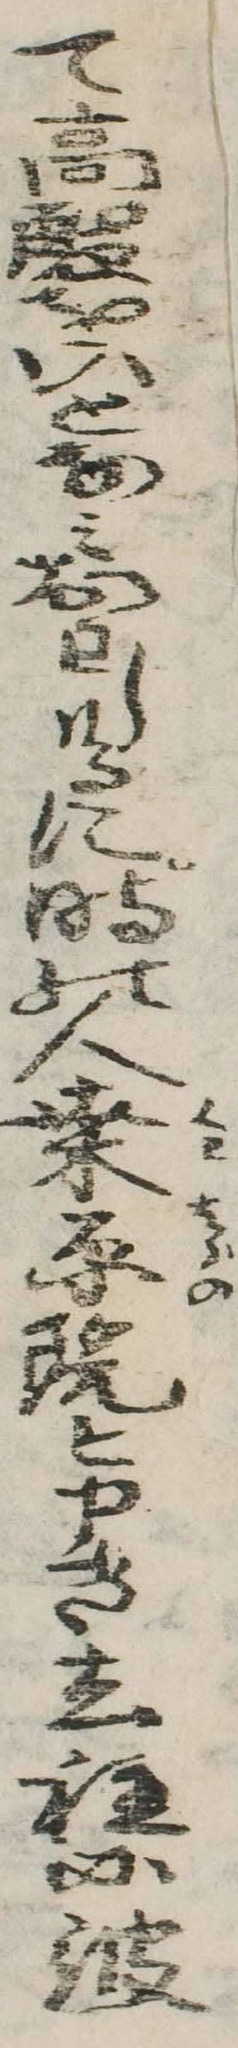て高殿をいとなみおわしけるに。時の人桑原院と申き去程に彼
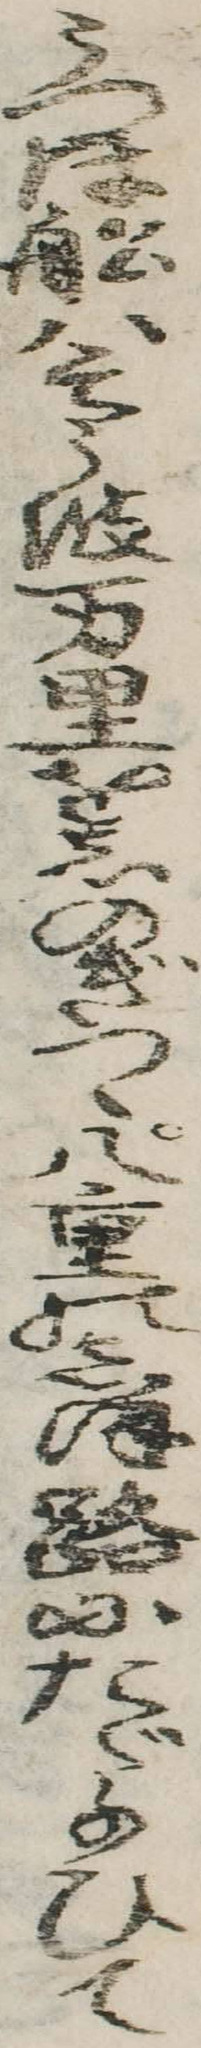うつほ船はそう波万里をしのぎつゝ。八重のしほ路にたゞよひて
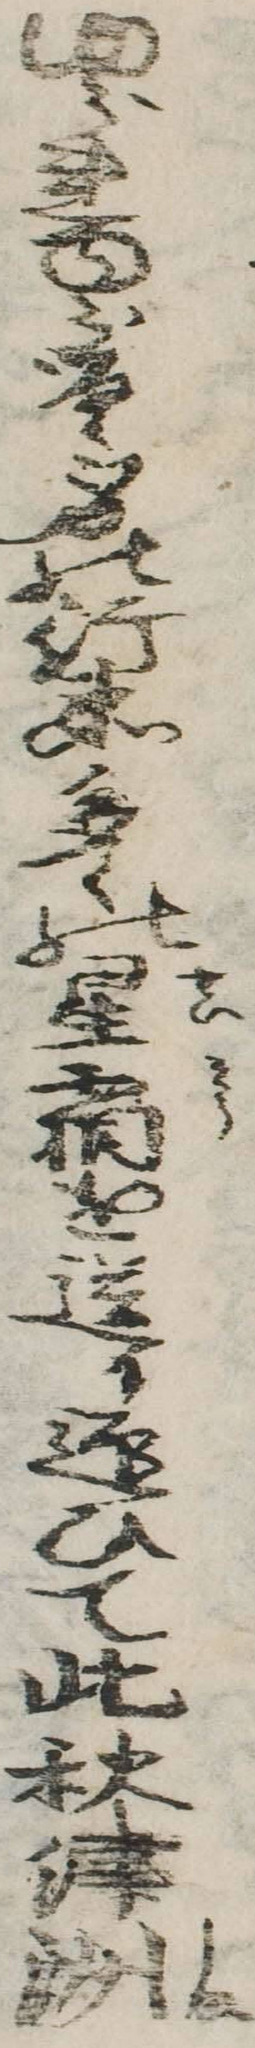ゆられゆらるゝ身の行末多くの星霜を送り迎ひて此秋津洲
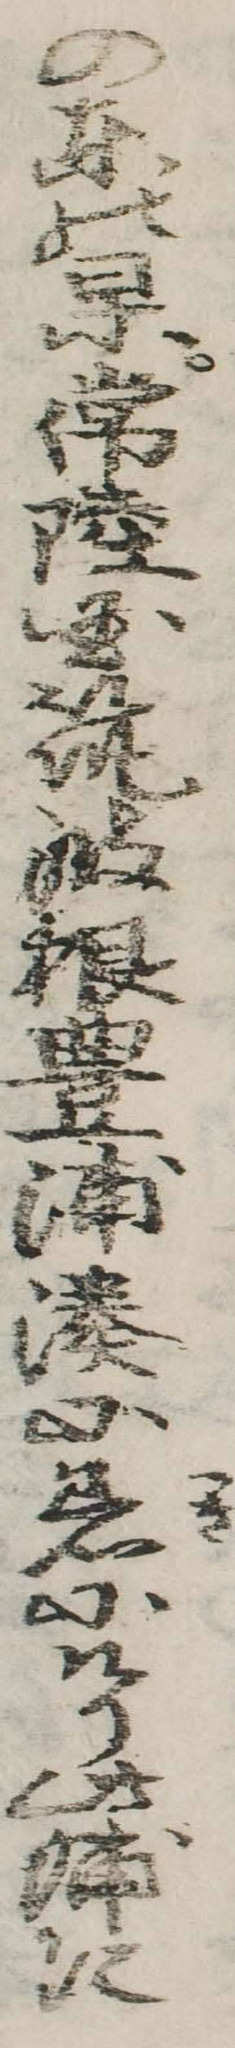の東の日本。常陸国筑波根豊浦湊に着にけり此浦に
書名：蚕影山畧縁起
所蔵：国文学研究資料館
